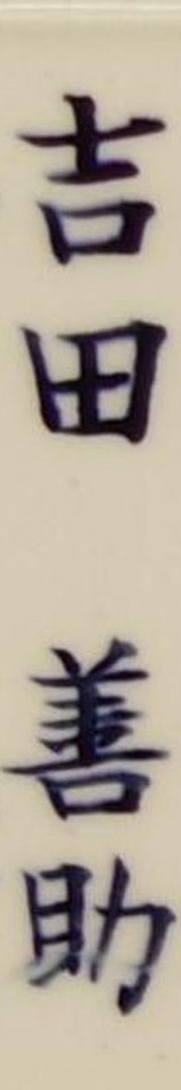吉田善助
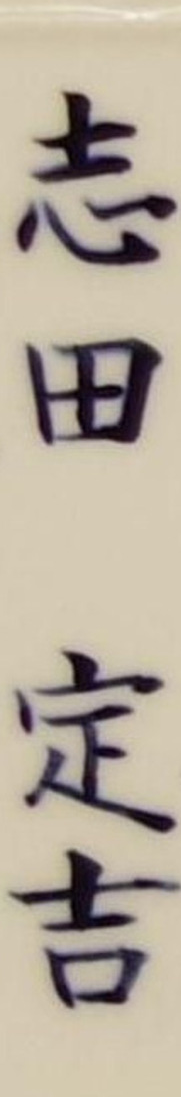志田定吉
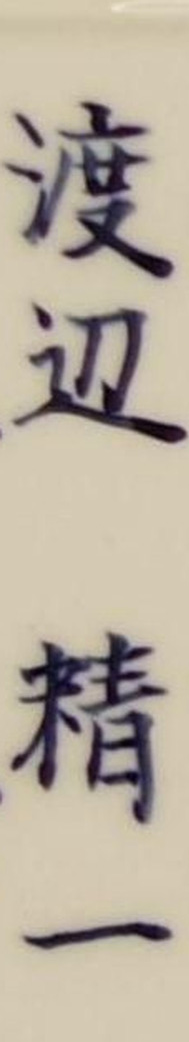渡辺精一
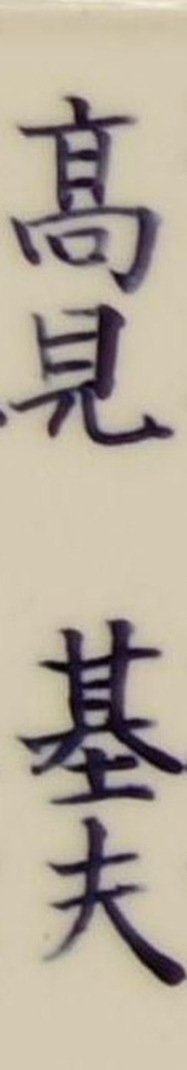高見基夫
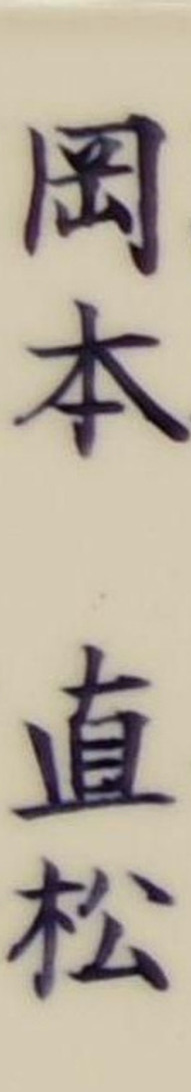岡本直松
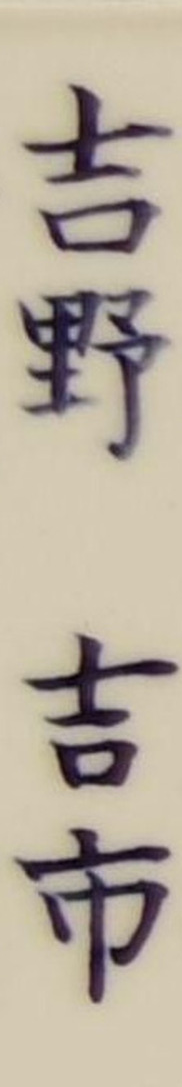吉野吉市
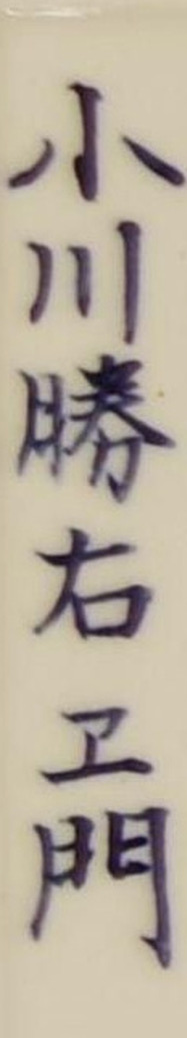小川勝右ヱ門

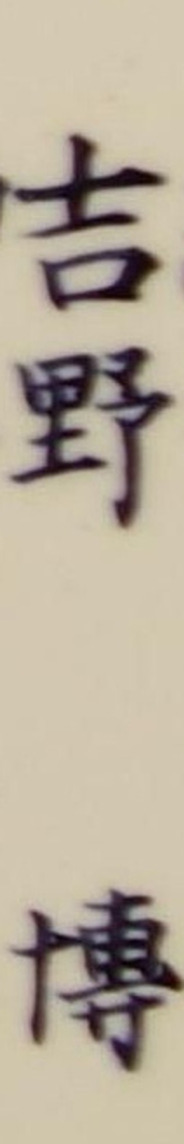吉野傳
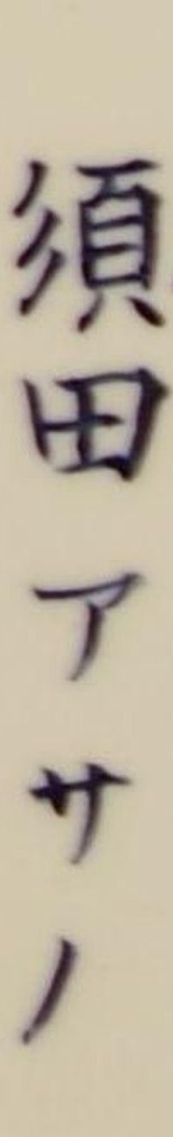須田アサノ
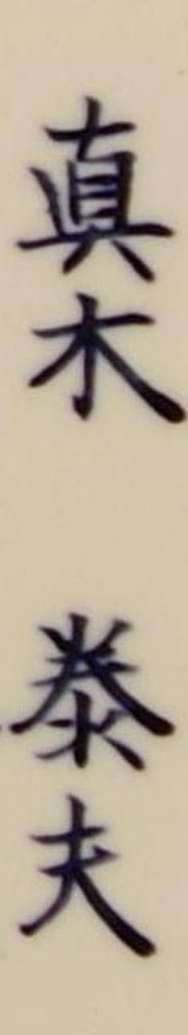真木泰夫
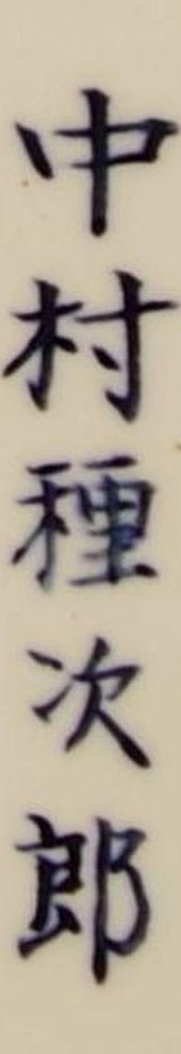中村種次郎
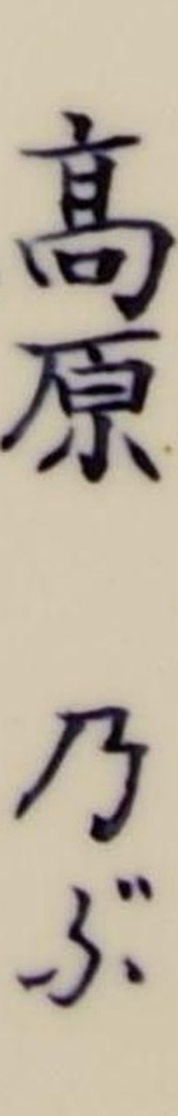高原乃ぶ
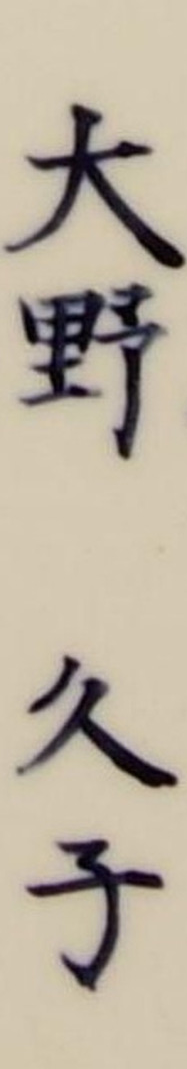大野久子
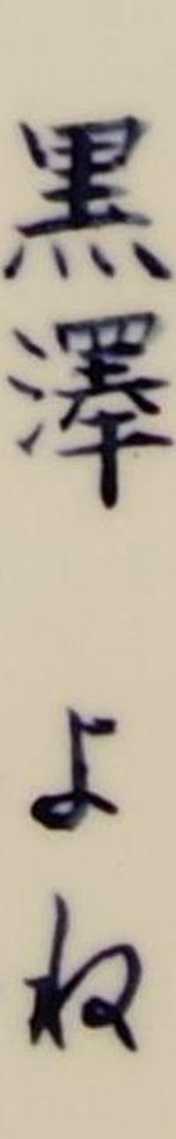黒澤よね
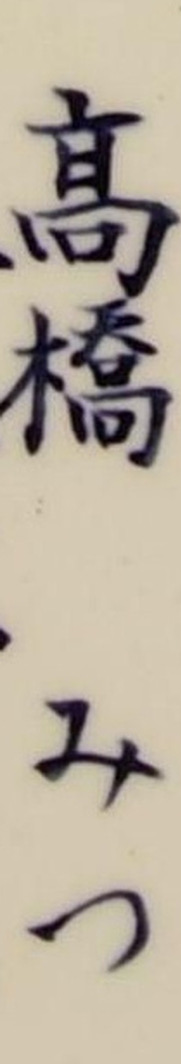高橋みつ
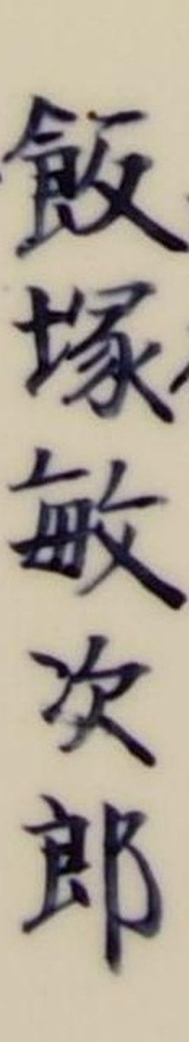飯塚敏次郎
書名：E~L
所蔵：高野山金剛峯寺
